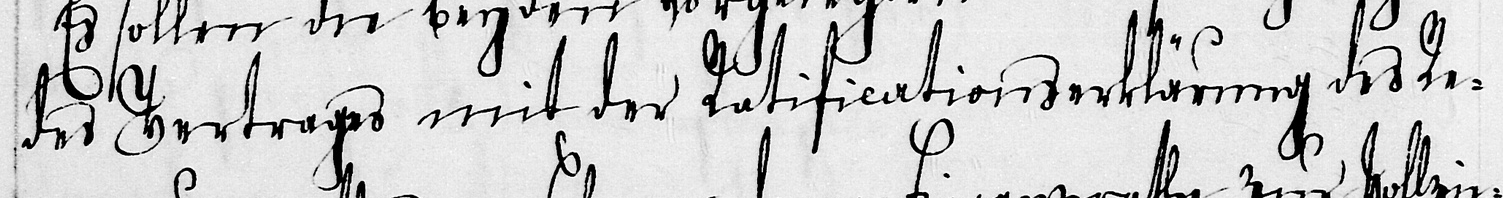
des Vertrages mit der Ratificationserklärung des Re¬
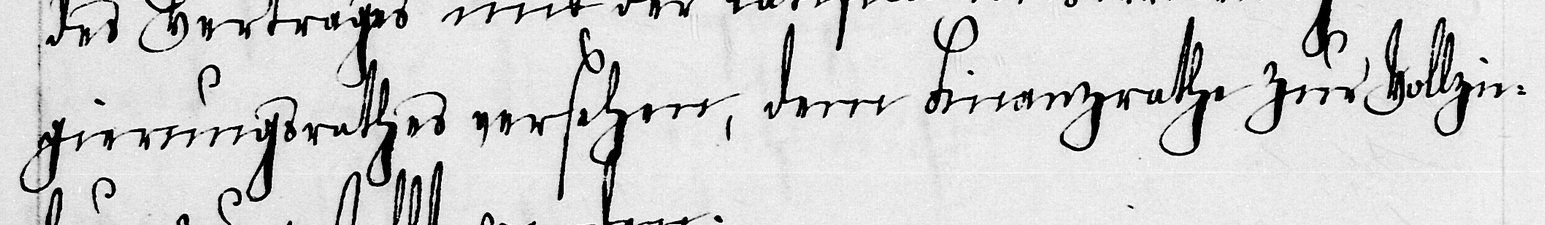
gierungsrathes versehen, dem Finanzrathe zur Vollzie¬
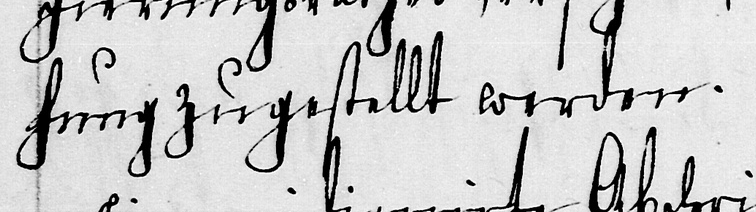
hung zugestellt werden.
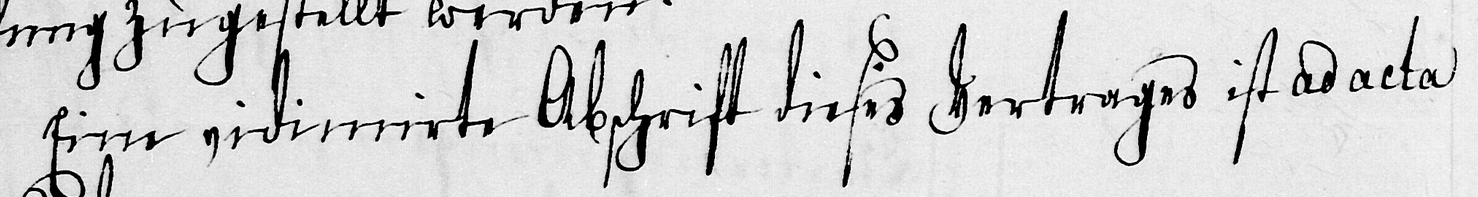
Eine vidimirte Abschrift dieses Vertrages ist ad acta
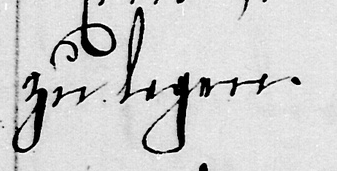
zu legen.
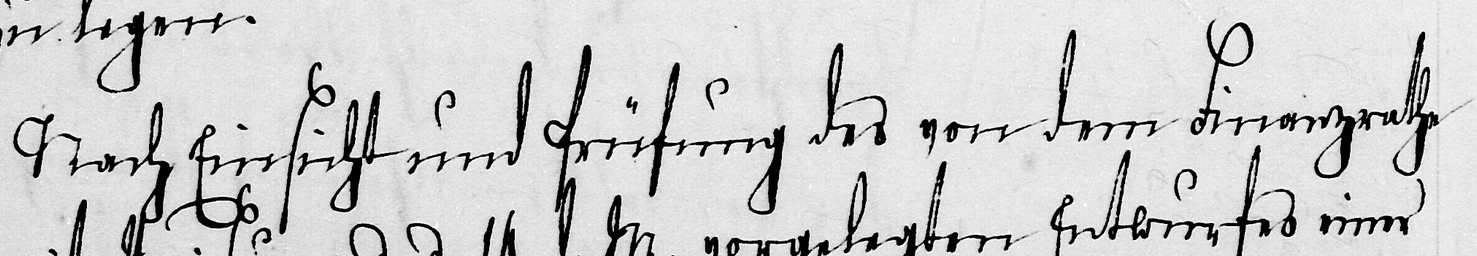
Nach Einsicht und Prüfung des von dem Finanzrathe
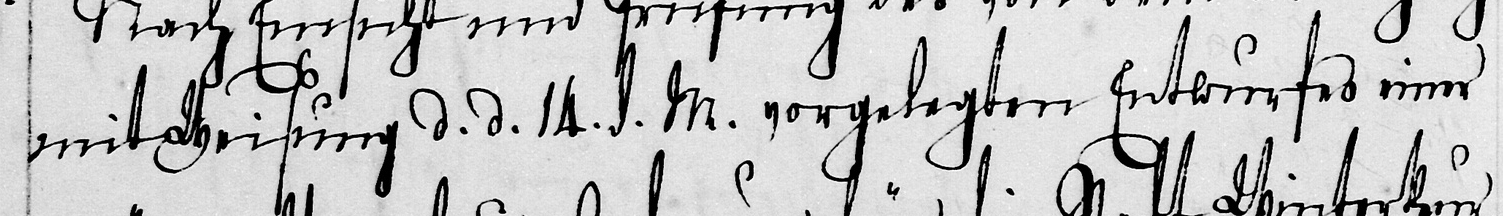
mit Weisung d. d. 14. d. M. vorgelegten Entwurfes einer
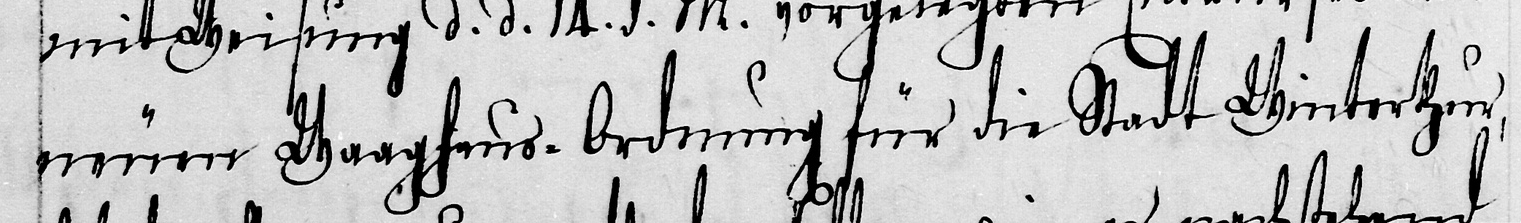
neuen Waaghaus-Ordnung für die Stadt Winterthur,
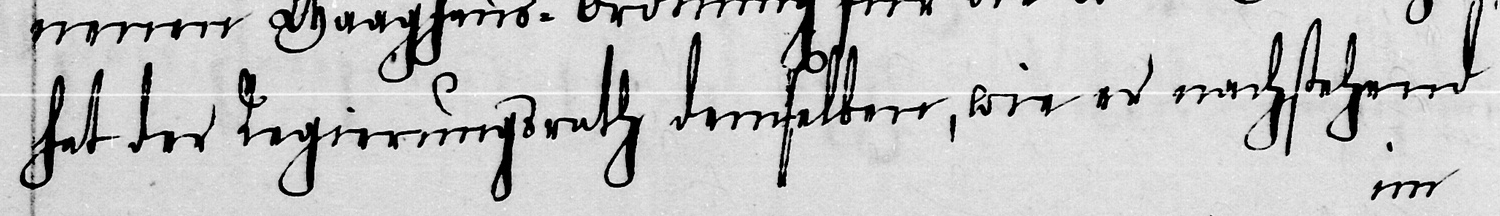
hat der Regierungsrath demselben, wie er nachstehend
